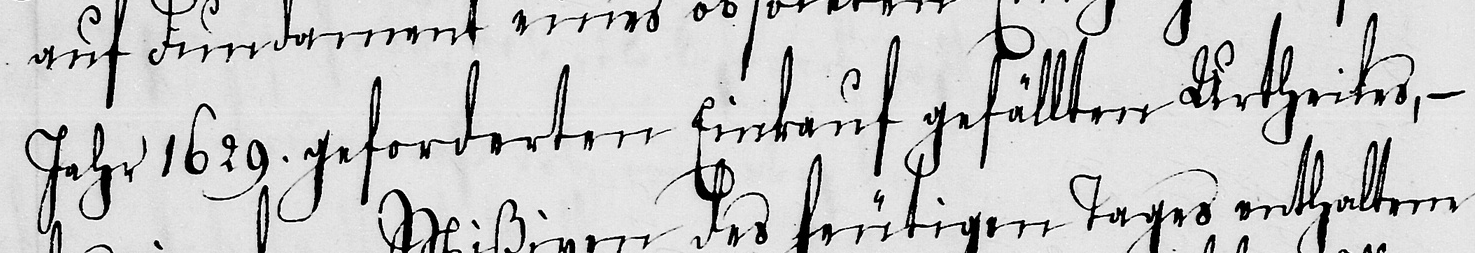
Jahr 1629. geforderten Einkauf gefällten Urtheiles,
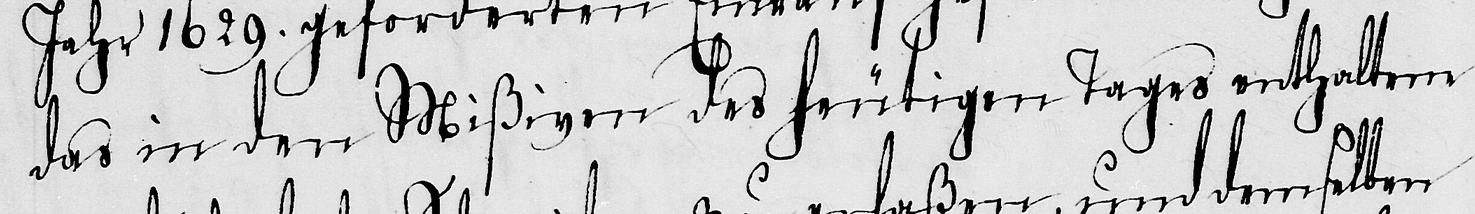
das in den Mißiven des heutigen Tages enthaltene
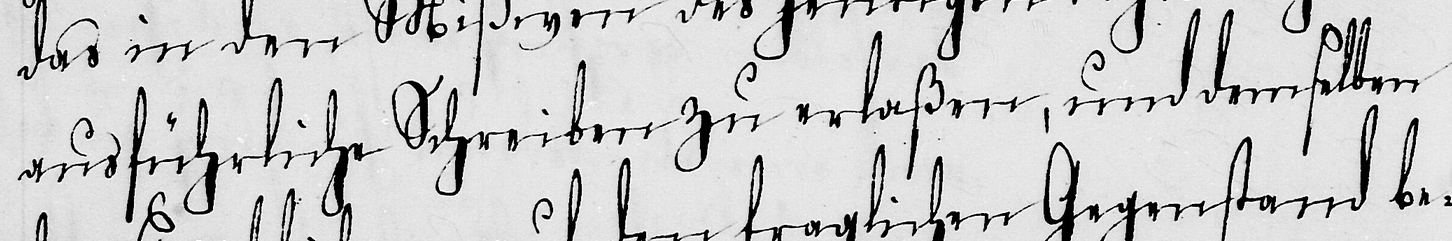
ausführliche Schreiben zu erlaßen, und demselben
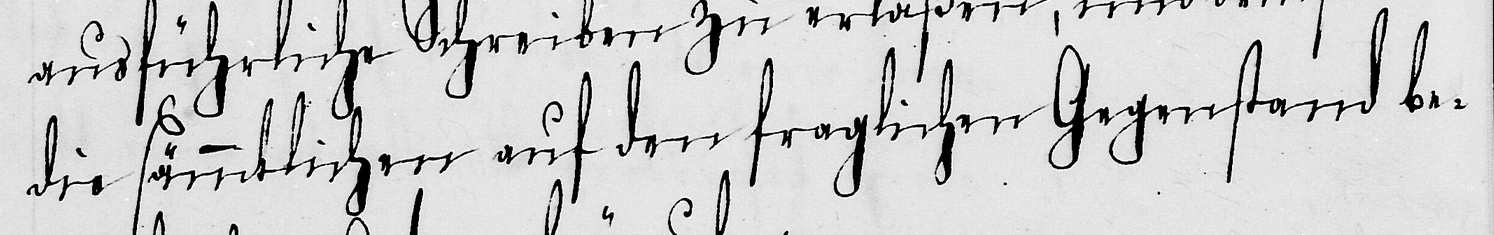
die sämmtlichen auf den fraglichen Gegenstand be¬
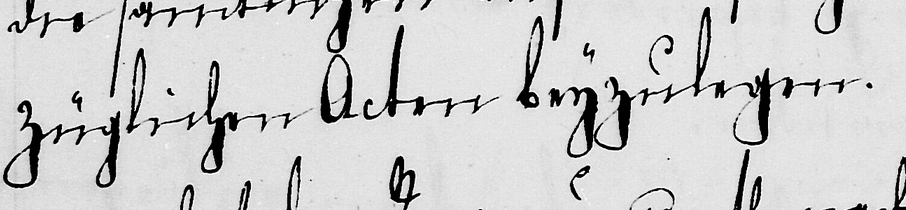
züglichen Acten beyzulegen.
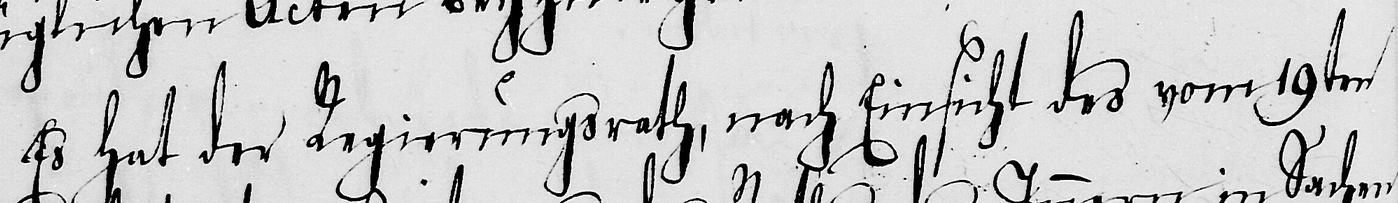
Es hat der Regierungsrath, nach Einsicht des vom 19ten
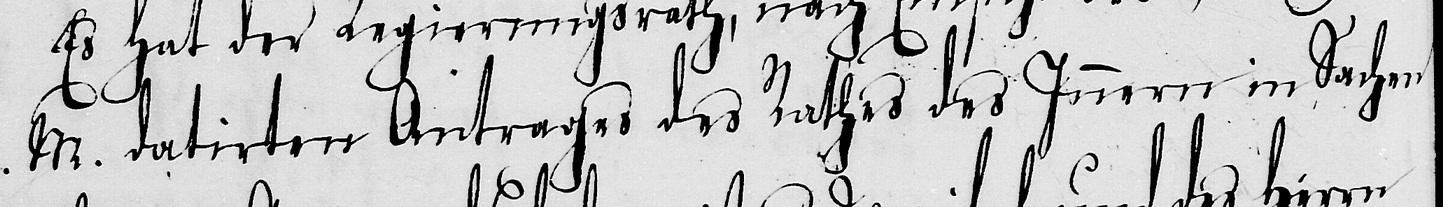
M. datirten Antrages des Rathes des Innern in Sachen
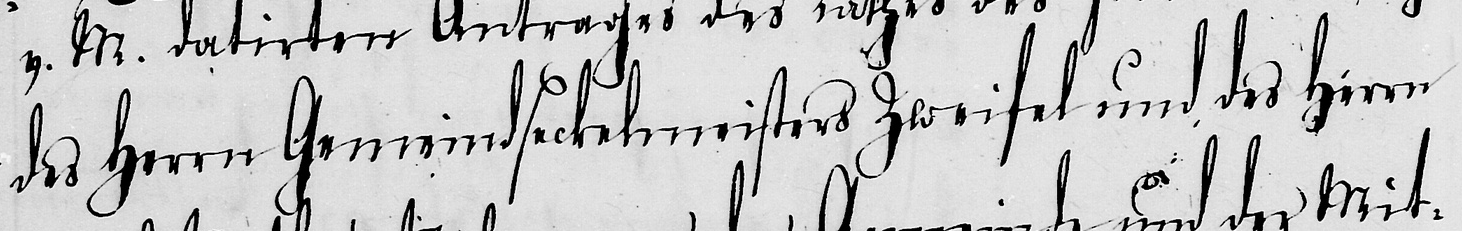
des Herrn Gemeindseckelmeisters Zweifel und des Herrn
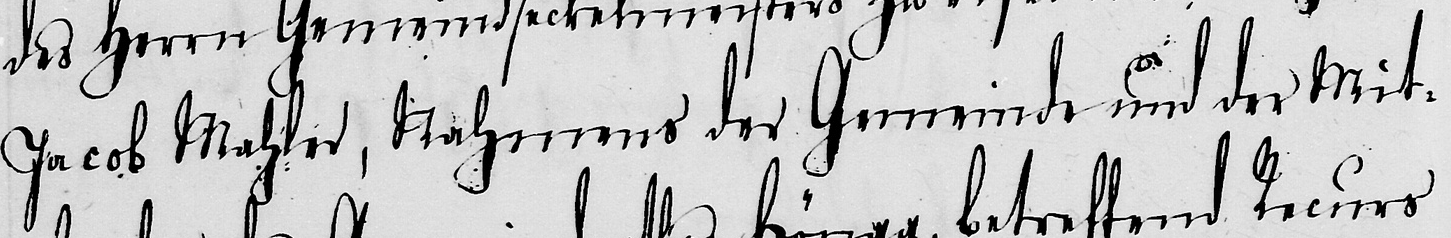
Jacob Mahler, Nahmens der Gemeinde und der Mit¬
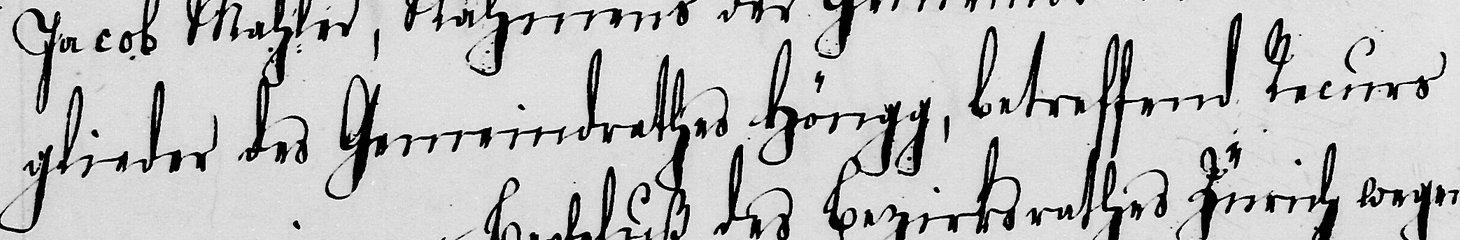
glieder des Gemeindrathes Höngg, betreffend Recurs
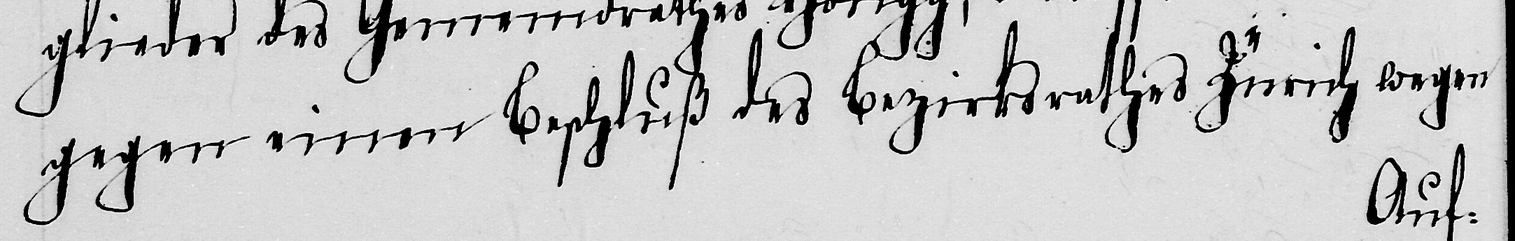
gegen einen Beschluß des Bezirksrathes Zürich wegen
